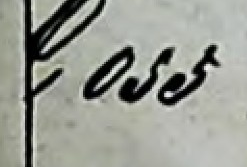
0,055
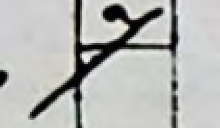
7
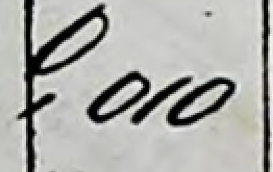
0,010
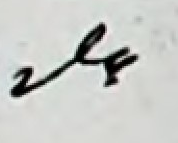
Do
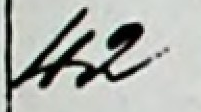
42
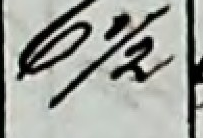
6 1/2
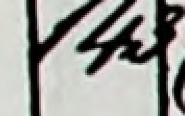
143
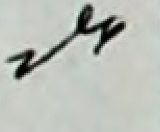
Do
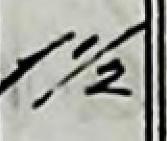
1 1/2
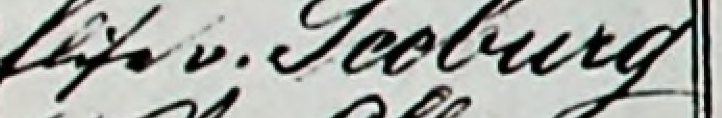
Elise v. Scoburg
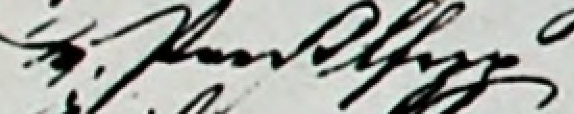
v. Penstlfepp
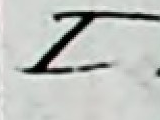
I
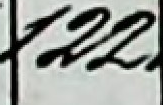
122
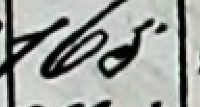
165
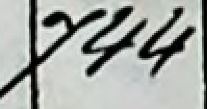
744
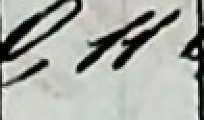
0,11
